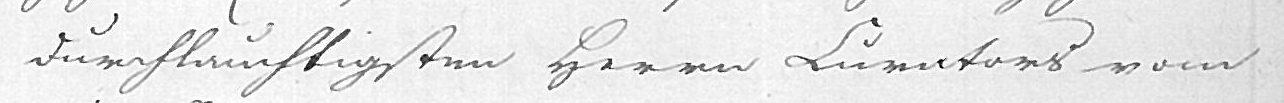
durchlauchtigsten Herrn Curators vom
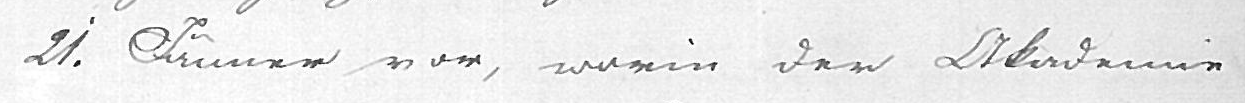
21. Jänner vor, worin der Akademie
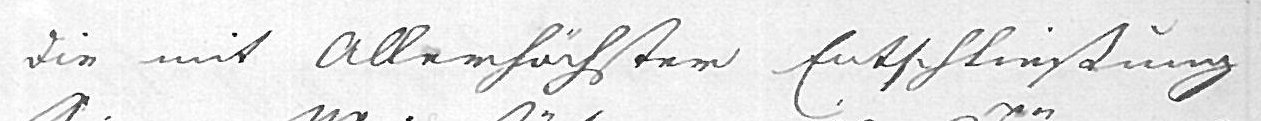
die mit Allerhöchster Entschließung
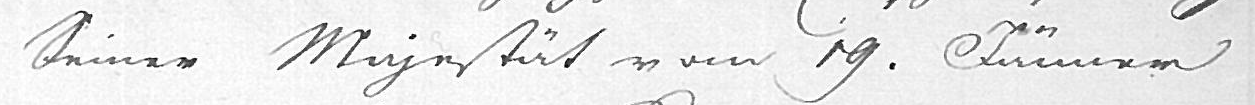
Seiner Majestät vom 19. Jänner
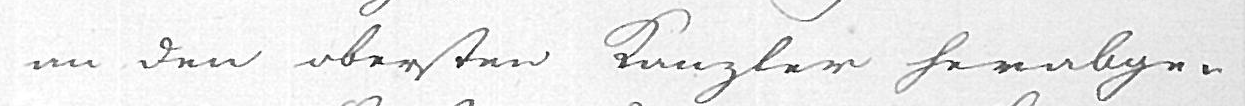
an den obersten Kanzler herabge-
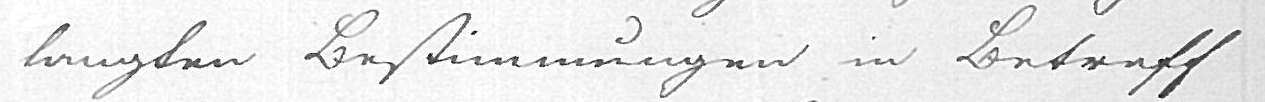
langten Bestimmungen im Betreffe
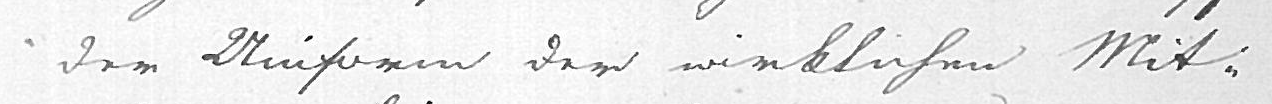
der Uniform der wirklichen Mit-
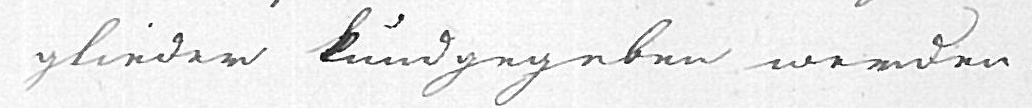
glieder kundgegeben werden.
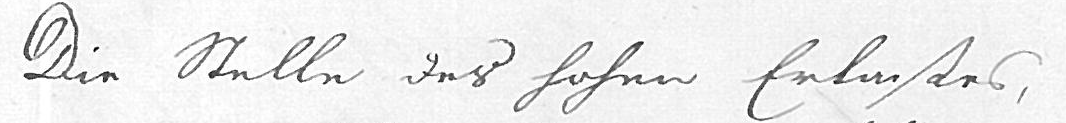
Die Stelle des hohen Erlaßes,
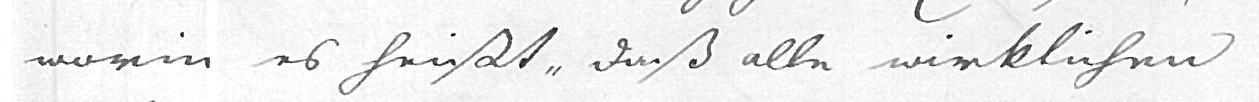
worin es heißt, daß alle wirklichen
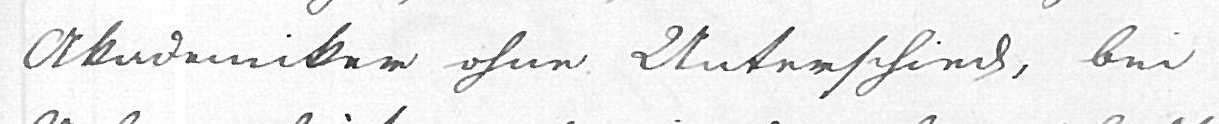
Akademiker ohne Unterschied, bei
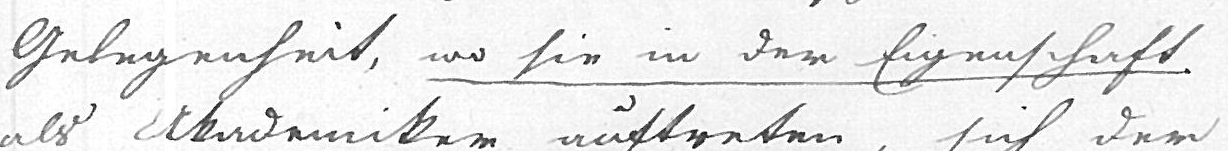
Gelegenheit, wo sie in der Eigenschaft
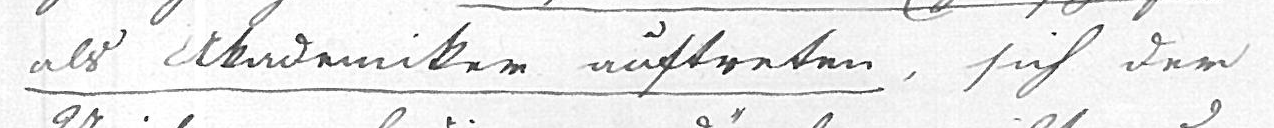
als Akademiker auftreten, sich der
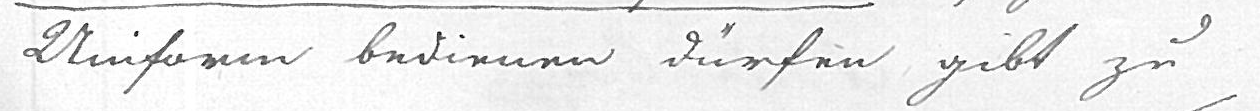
Uniform bedienen dürfen, gibt zu
